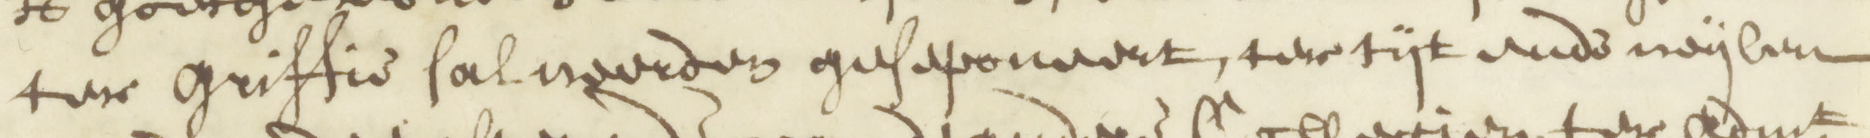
ter griffie sal worden geseponeert, ter tijt ende wijlen
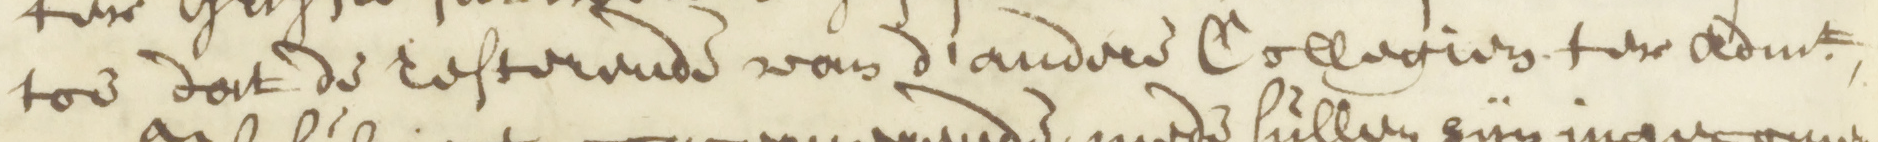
toe dat de resterende van d'andere Collegien ter Admt.
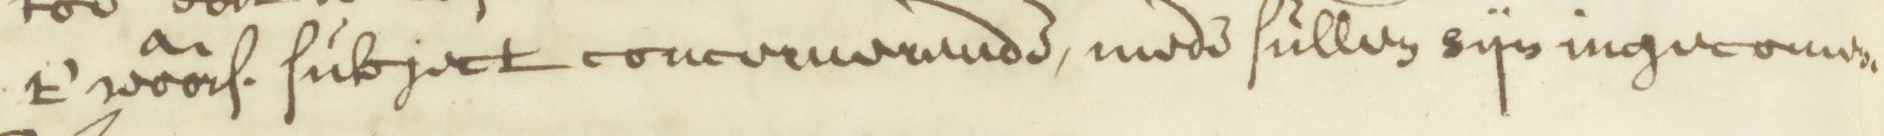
ter voors. subject concernerende, mede sullen sijn ingecomen.
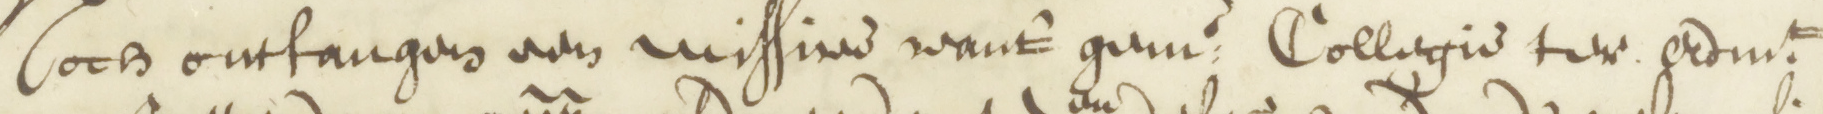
Noch ontfangen een missive van t' geme. Collegie ter admt
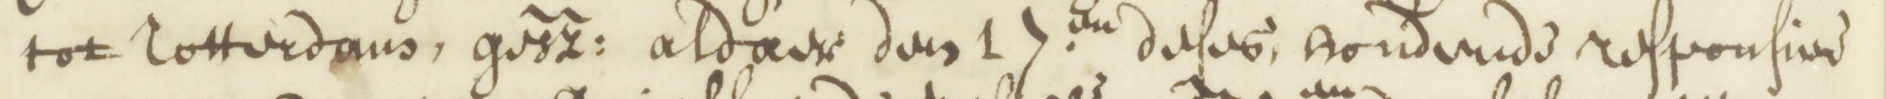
tot Rotterdam, gesr. aldaer den 17en deses, houdende responsive
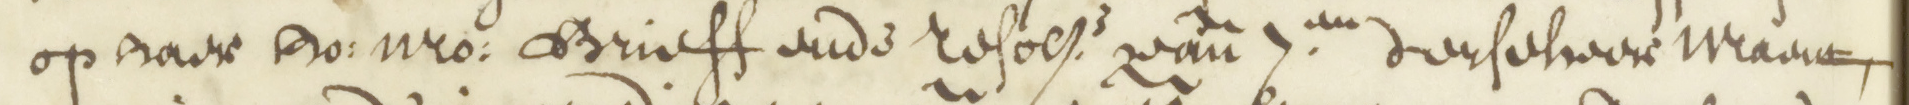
op haer Ho:Mo: Brieff ende resol. van 7en derselver maent
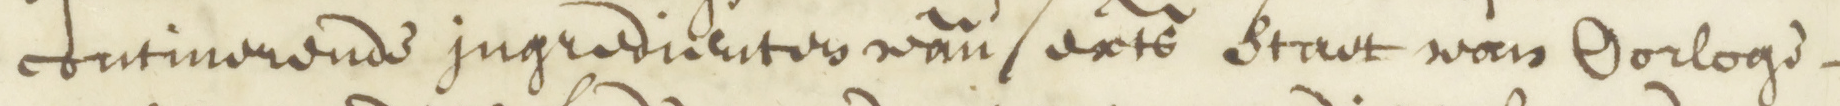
continerende ingredienten van exts Staet van oorloge —
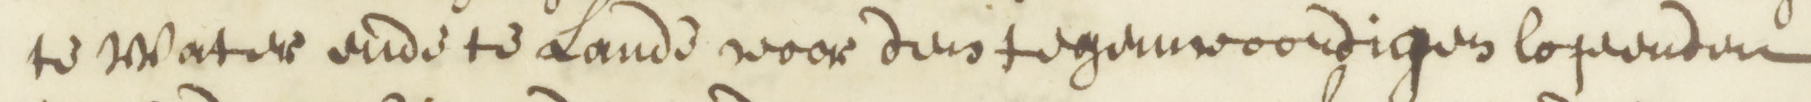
te Water ende te Lande voor den tegenwoordigen lopenden
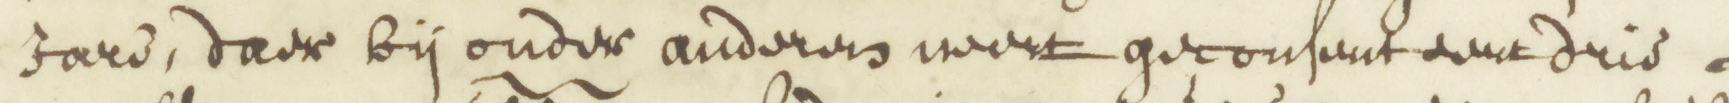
Jare, daer bij onder anderen wert geconsenteert drie
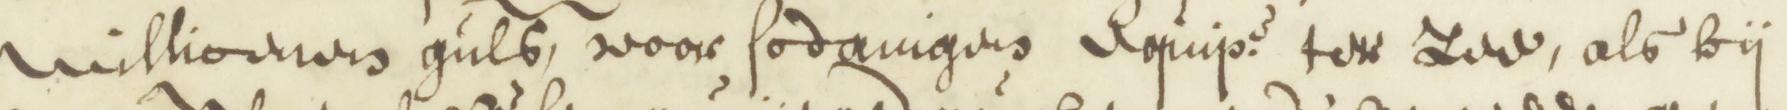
millioenen guls voor sodanigen Equipe. ter Zee, als bij
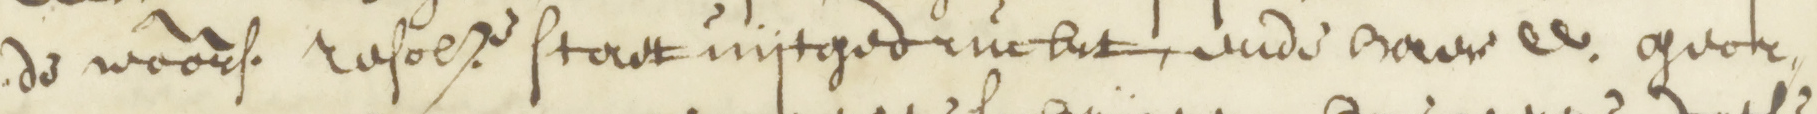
de voors. resole. staet uijtgedruckt, ende haer E. geor„
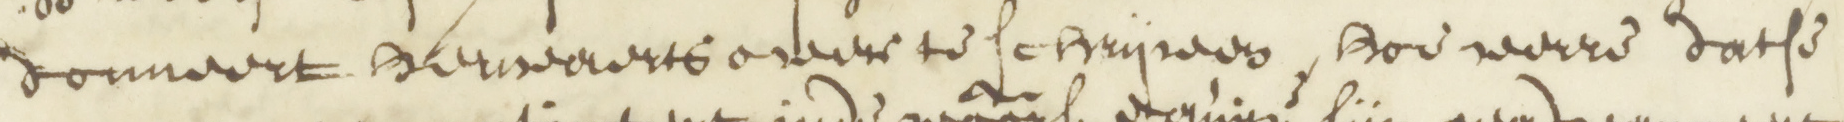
donneert herwaerts over te schrijven, hoe verre datse
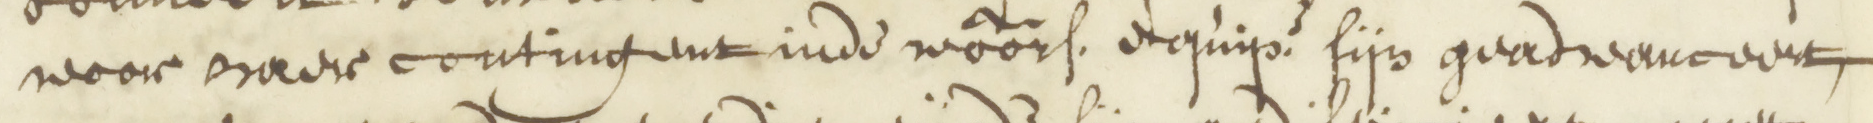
voor haer contingent in de voors. Equipe. sijn geadvanceert,
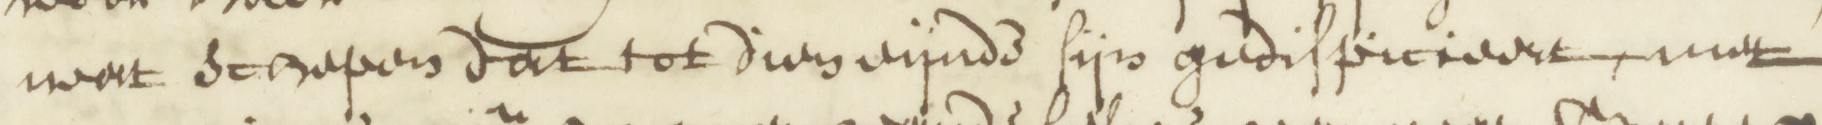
wat schepen dat tot dien eijnde sijn gedispicieert, met
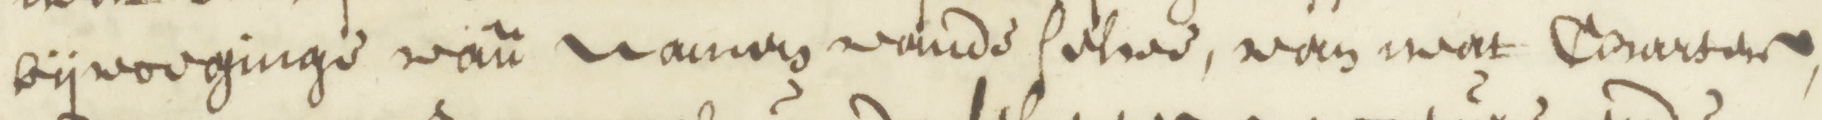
bijvoeginge van namen vande selve, van wat charter
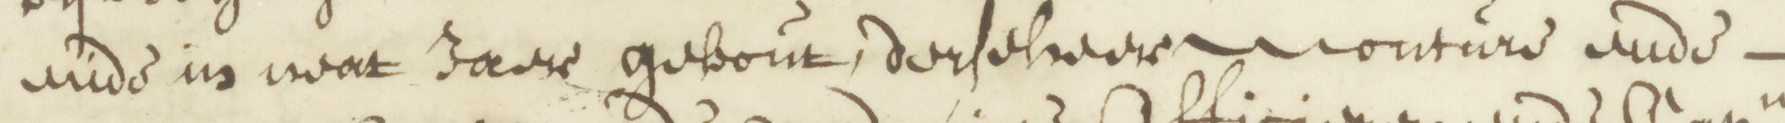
ende in wat Jaer gebout, derselve monture ende —
